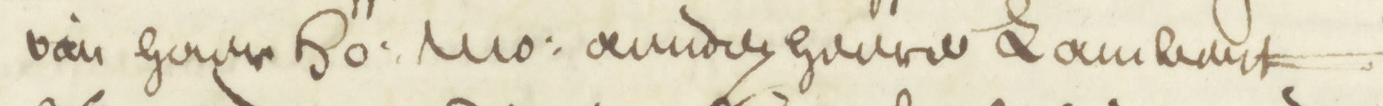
van haer Ho:Mo: aenden heere Lambert
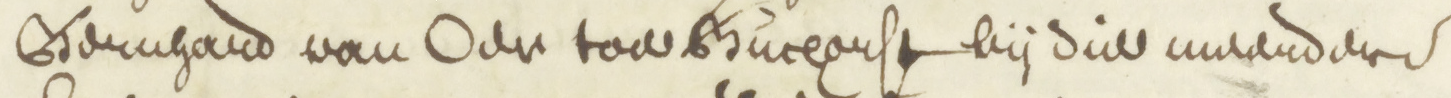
Bernhard van Oer toe Buchorst bij die meerdere
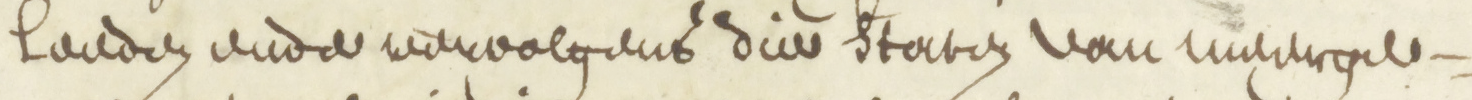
Leeden ende vervolgens die Staten van meerge-
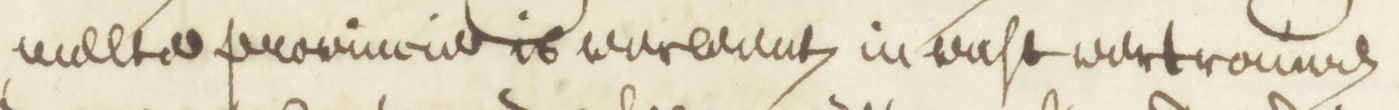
melte provincie is verleent in vast vertrouwen
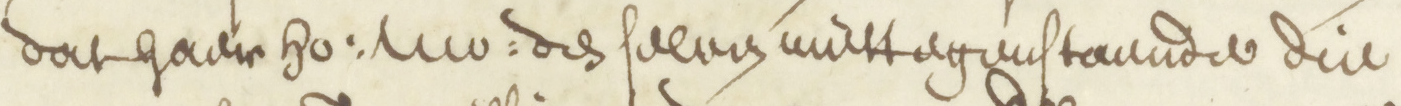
dat haer Ho:Mo: den selven niettegenstaende die
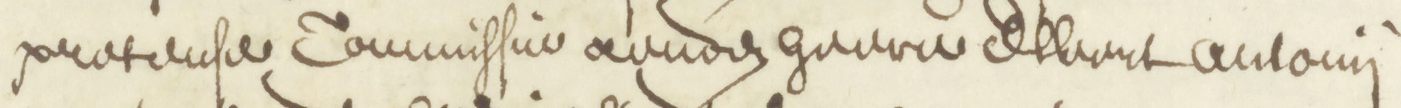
pretense Commissie aenden heere Elbert Antonij
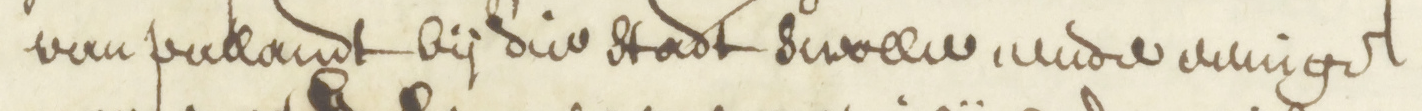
van pallandt bij die Stadt Swolle, ende eenige
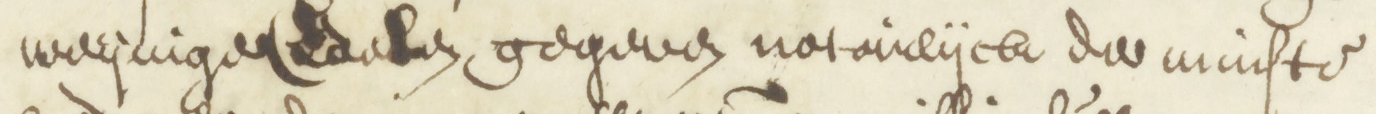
weijnige Edelen gegeven notoirlijck die minste
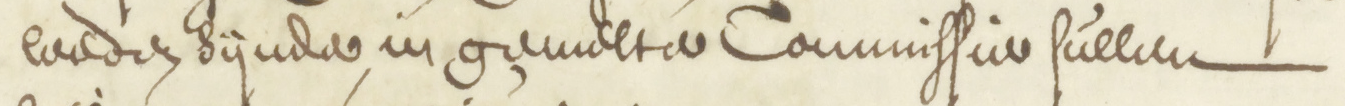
leeden sijnde, in gemelte Commissie sullen
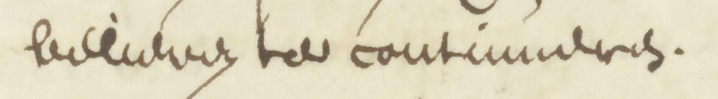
believen te continueren.
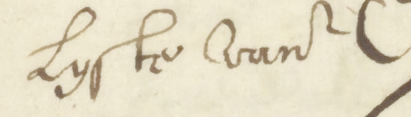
Lijste van Co & licenten
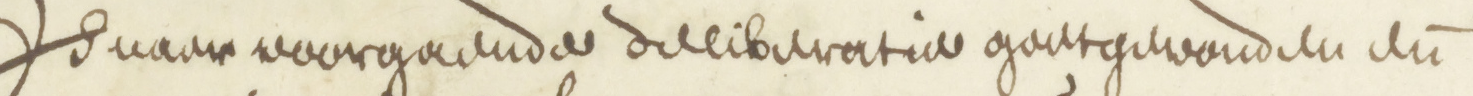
Is naer voorgaende deliberatie goetgevonden en
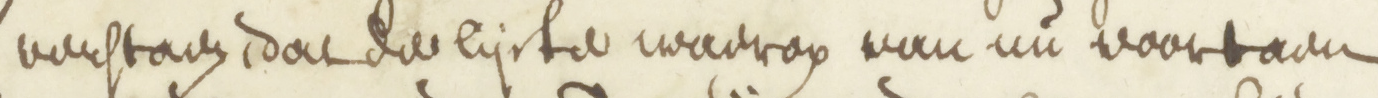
verstaen, dat de lijste waerop van nu voortaen
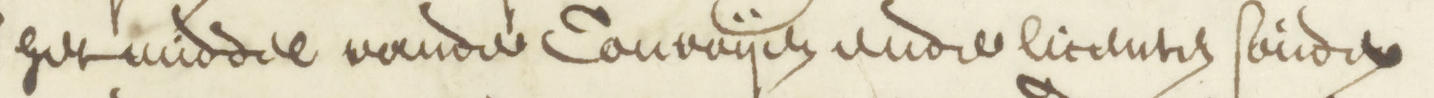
het middel van de Convoijen ende licenten souden
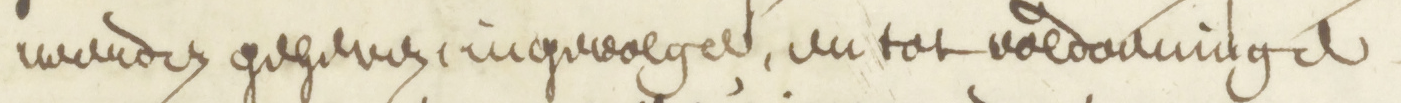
werden gegeven, ingevolge, en tot voldoeninge —
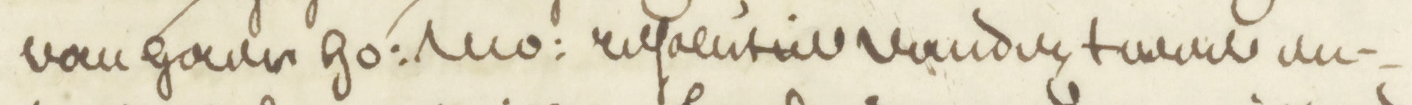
van haer Ho:Mo: resolutie vanden twee en-
